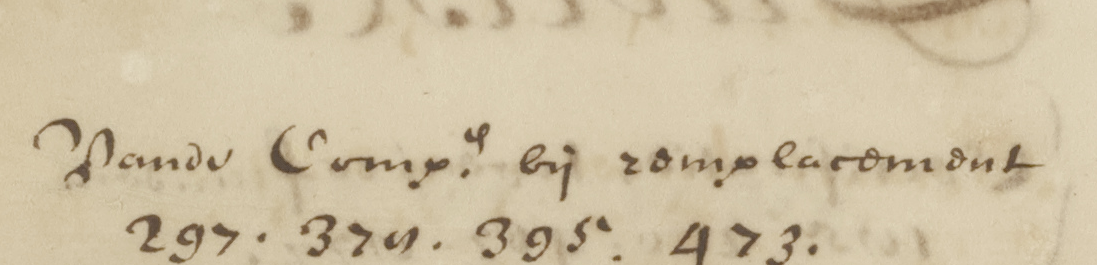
Vande Compe. bij remplacement
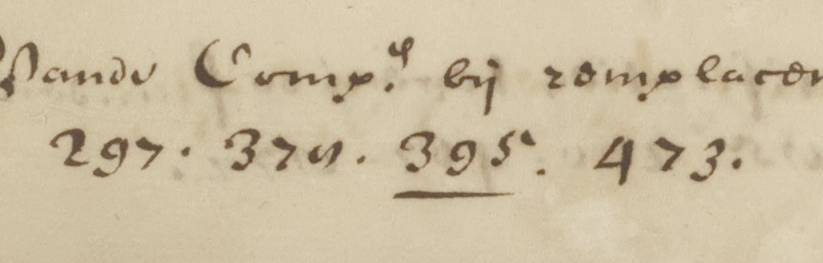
297. 378. 395. 473.
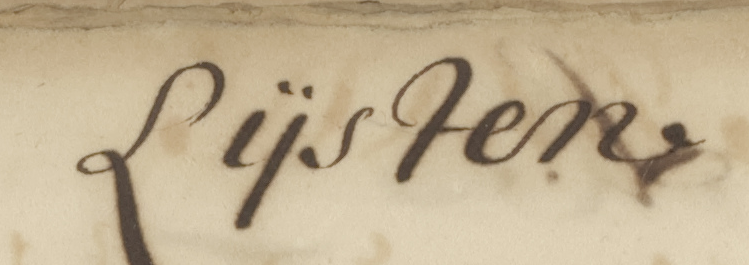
Lijsten.
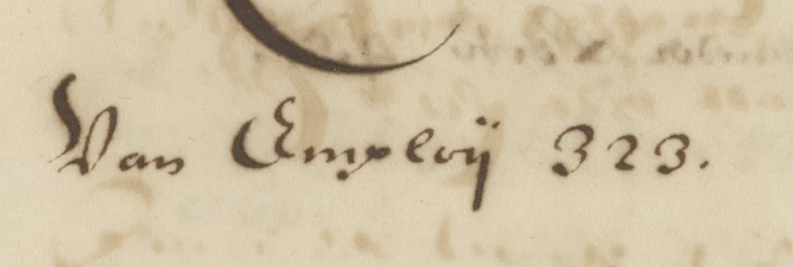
Van Emploij 323.
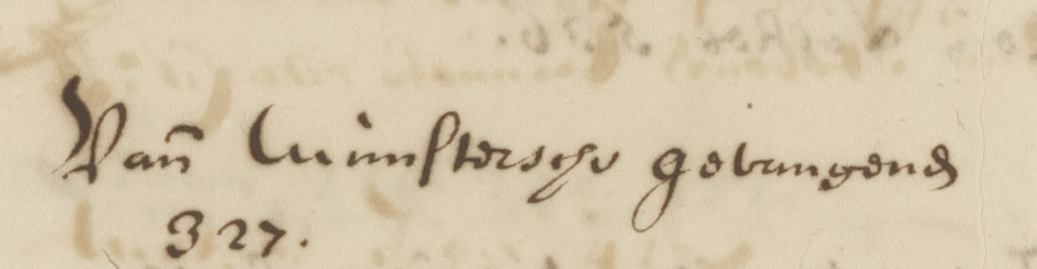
Van Munstersche gevangenen
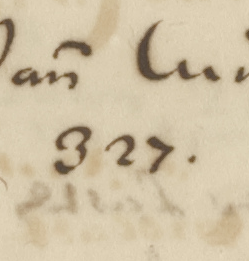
327.
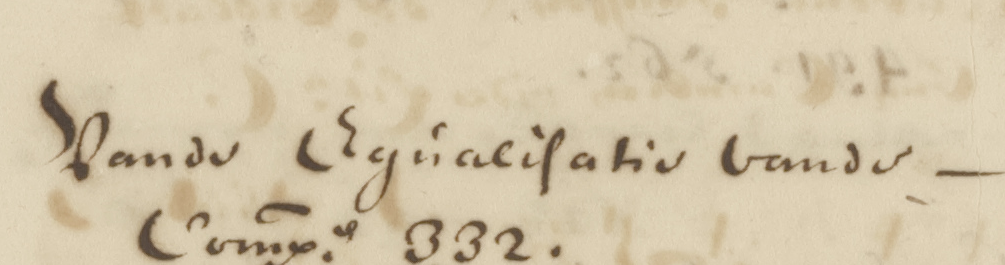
Vande Equalisatie vande
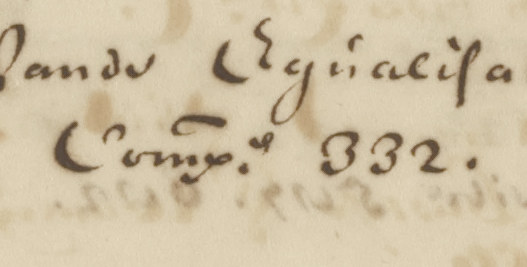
Compe. 332.
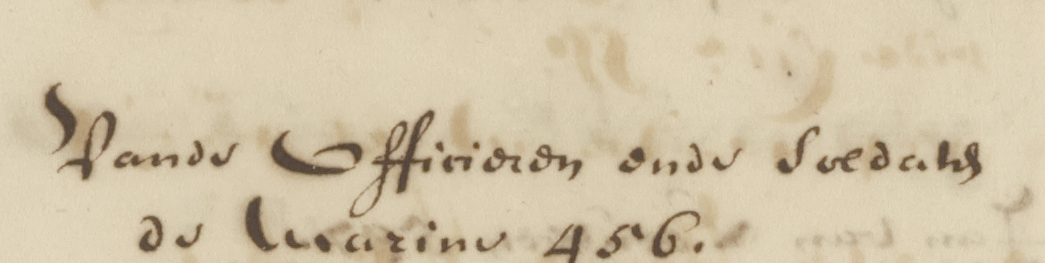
Vande Officieren ende Soldaten
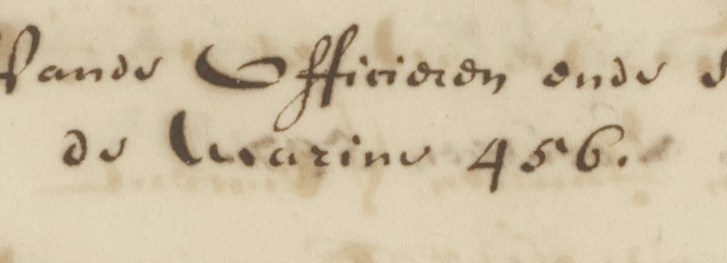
de Marine 456.
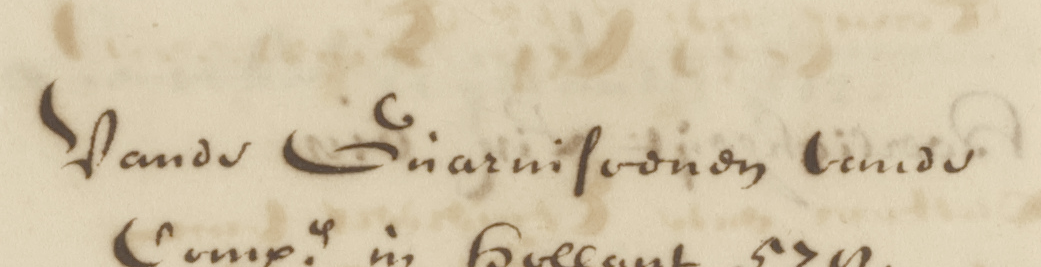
Vande Guarnisoenen vande
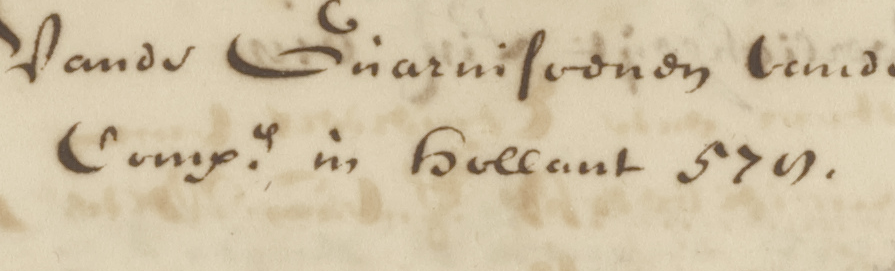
Compe. in Hollant 578.
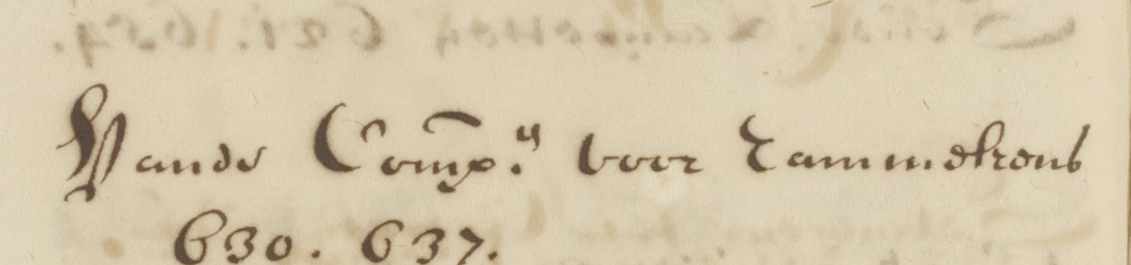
Vande Compe. voor Rammekens
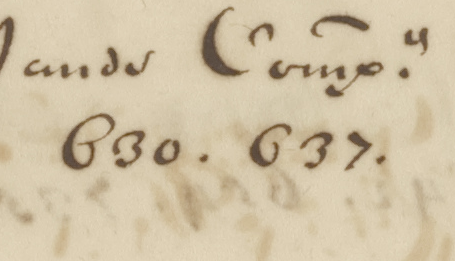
630. 637.
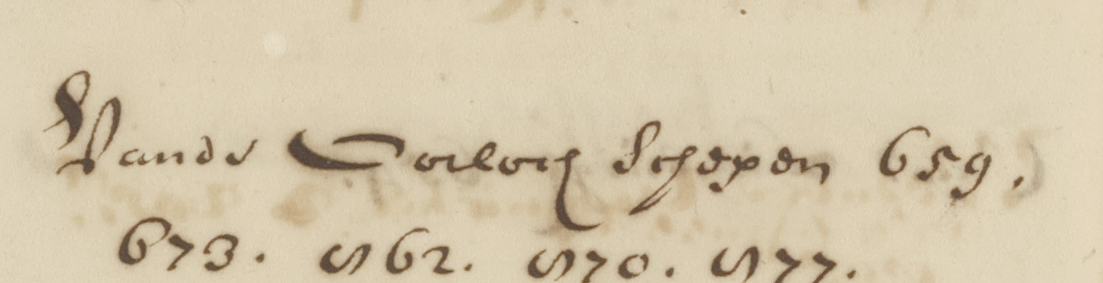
Vande Oorloch schepen 659.
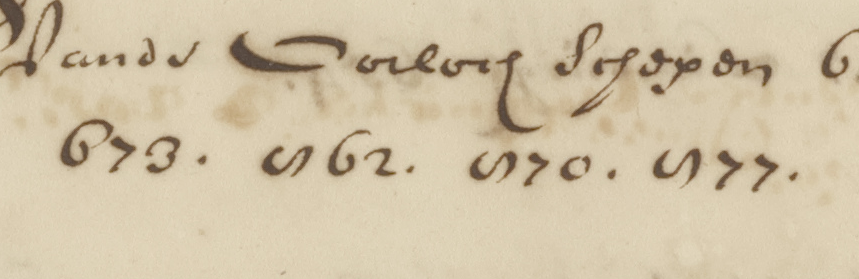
673. 862. 870. 877.
